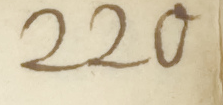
220
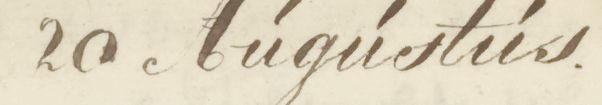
20. Augustus.
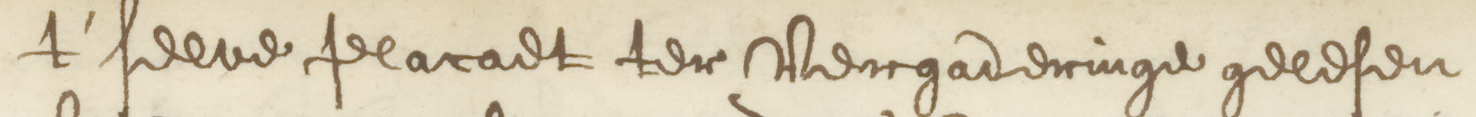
t'selve placaet ter vergaderinge gelesen
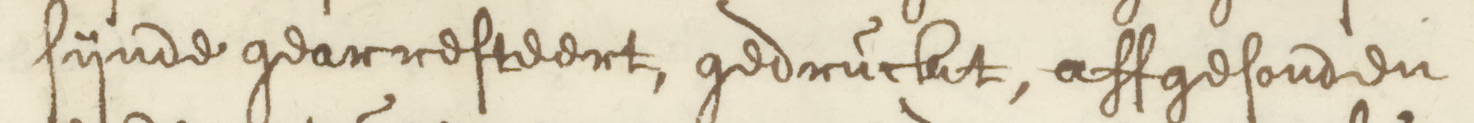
sijnde gearresteert, gedruckt, affgesonden
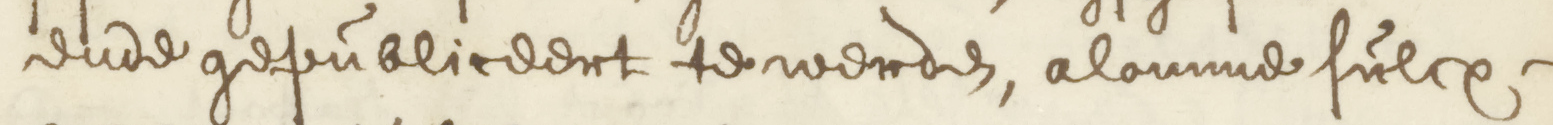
ende gepubliceert te werden, alomme sulcx
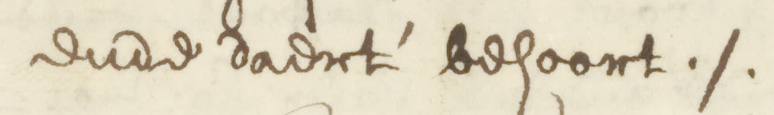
ende daert' behoort.
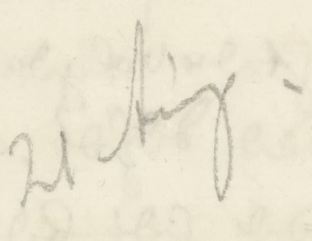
21 Aug.
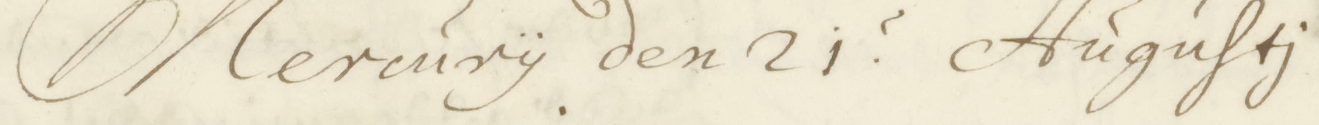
Mercurij den 21e Augusti
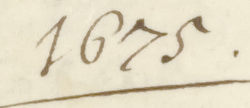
1675.
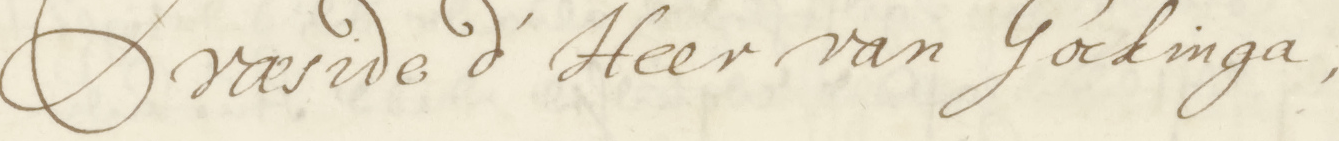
Præside d'Heer van Gockinga
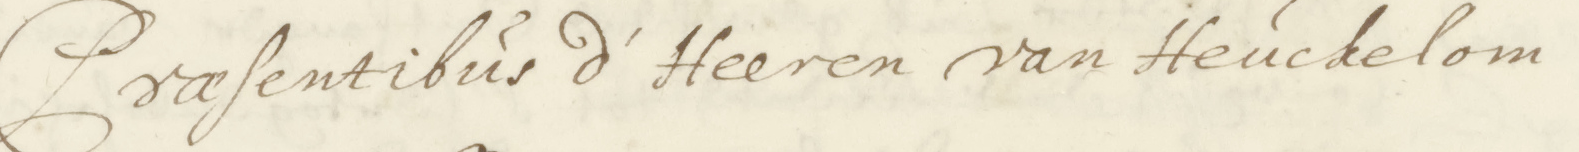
Præsentibus d'Heeren van Heuckelom
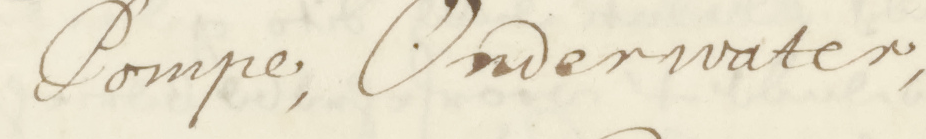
Pompe, Onderwater,
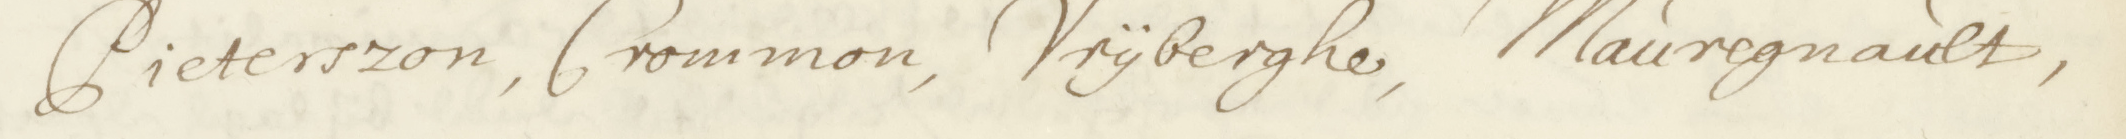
Pieterszon, Crommon, Vrijberghe, Mauregnault,
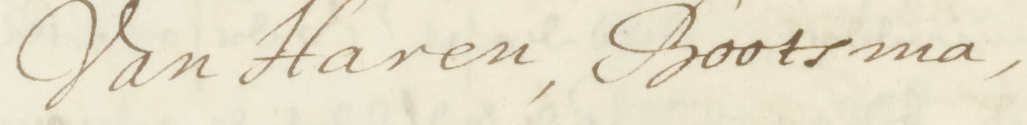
Van Haren, Bootsma
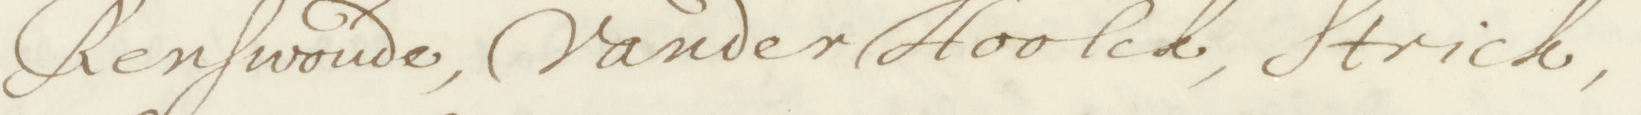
Renswoude, Vander Hoolck, Strick,
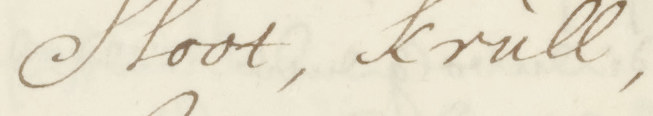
Sloot, Krull,
